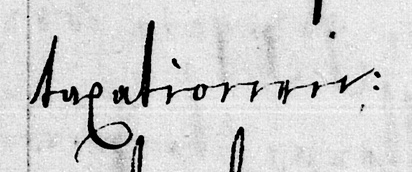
taxationen.
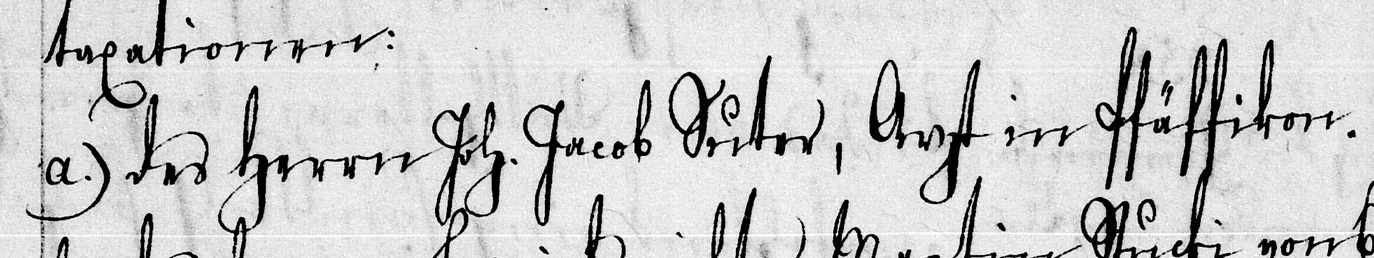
a.) des Herrn Joh. Jacob Suter, Arzt in Pfäffikon.
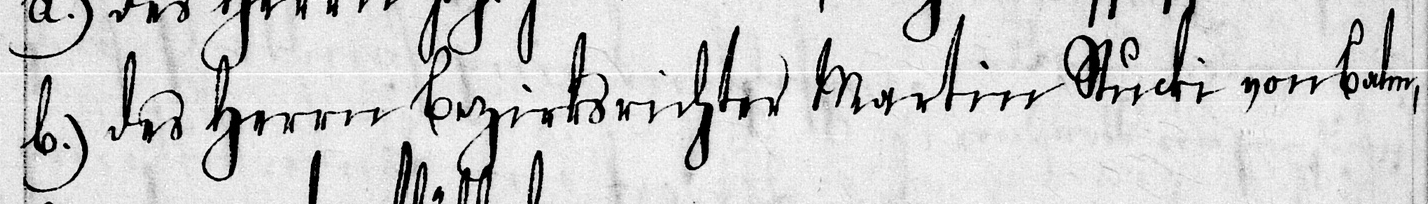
b.) des Herrn Bezirksrichter Martin Stucki von Balm,
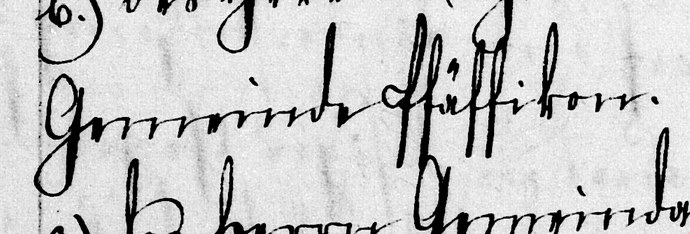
Gemeinde Pfäffikon.
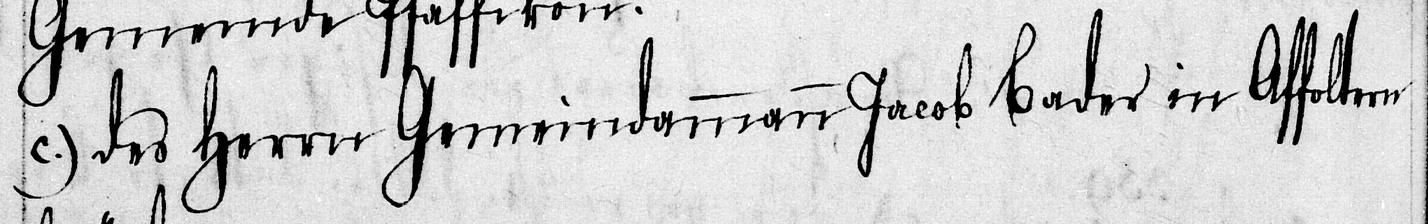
c.) des Herrn Gemeindammann Jacob Bader in Affoltern
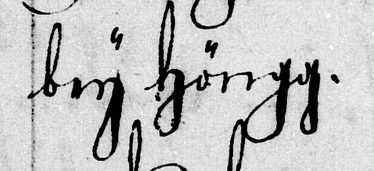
bey Höngg.
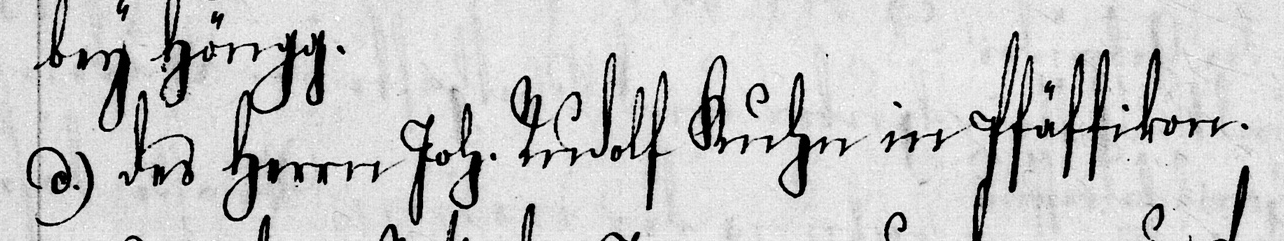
d.) des Herrn Joh. Rudolf Kuhn in Pfäffikon.
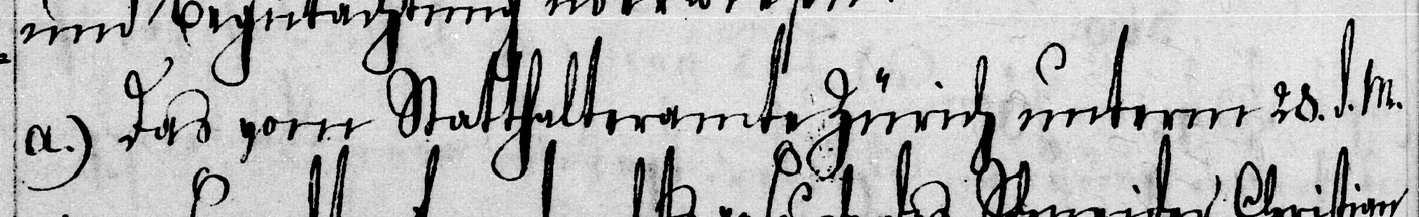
a.) Das vom Statthalteramte Zürich unterm 28. d.
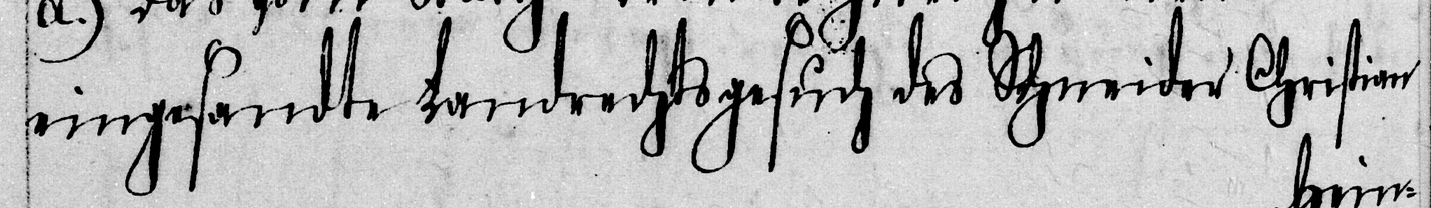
eingesandte Landrechtsgesuch des Schneider Christi¬
